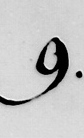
1.)
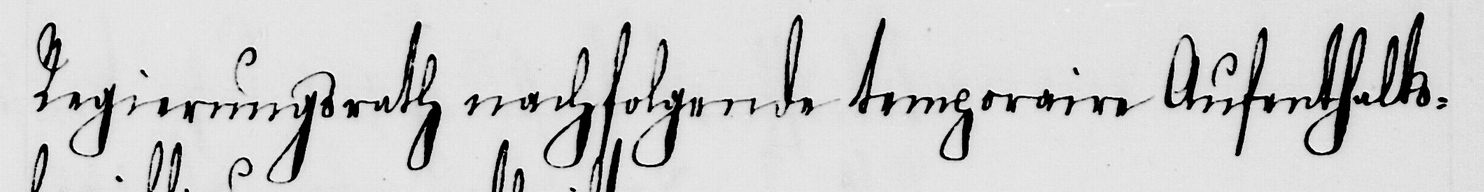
Regierungsrath nachfolgende temporaire Aufenthalts¬
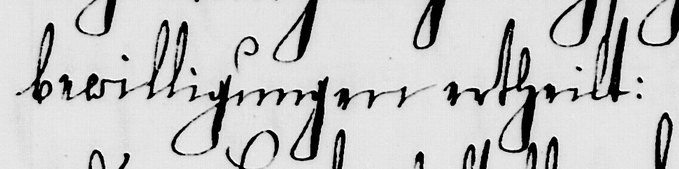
bewilligungen ertheilt:
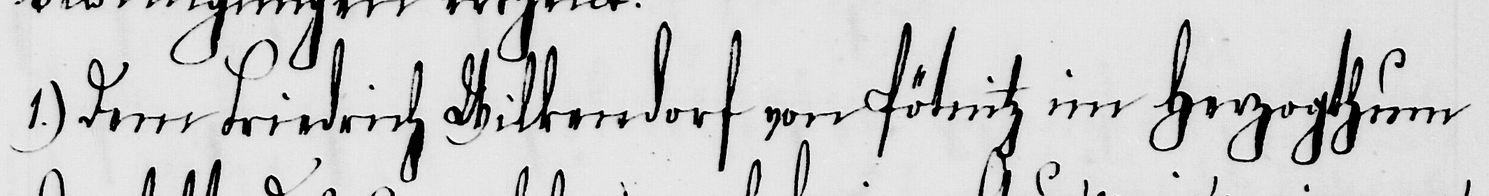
Dem Friedrich Wilkendorf von Pötnitz im Herzogthum
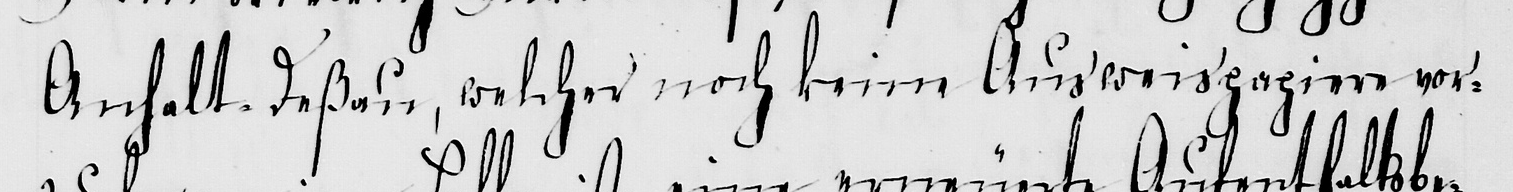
Anhalt-Deßau, welcher noch keine Ausweispapiere vor¬
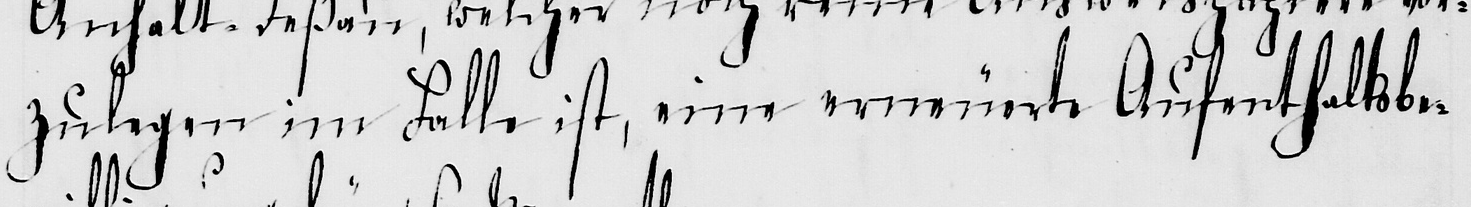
zulegen im Falle ist, eine erneuerte Aufenthaltsbe¬
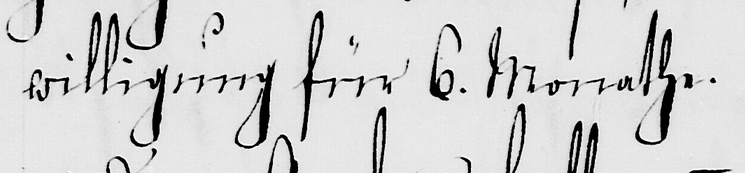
willigung für 6. Monathe.
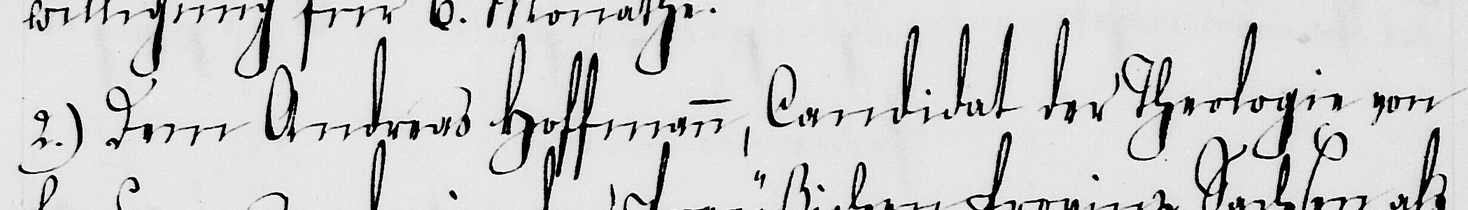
2.) Dem Andreas Hoffmann, Candidat der Theologie von
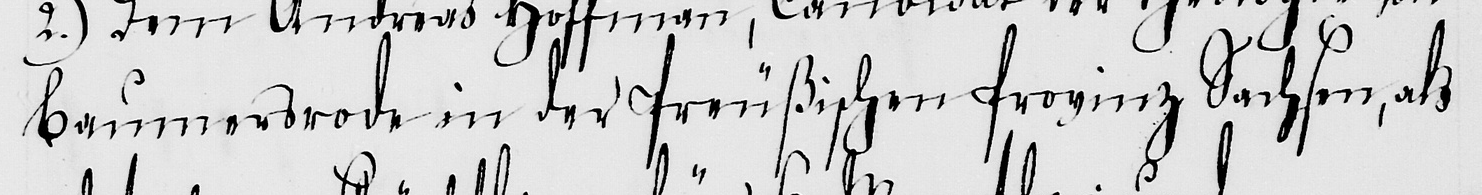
Baumersrode in der Preußischen Provinz Sachsen, als
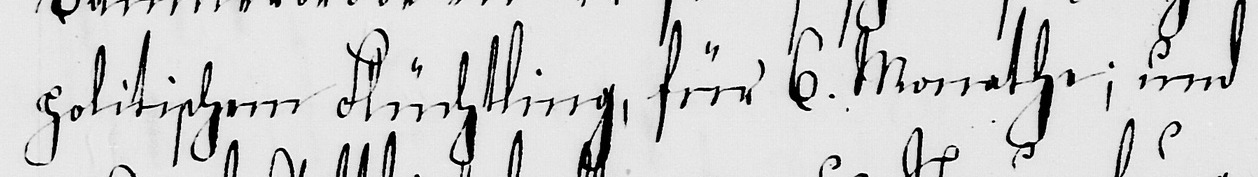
politischem Flüchtling, für 6. Monathe; und
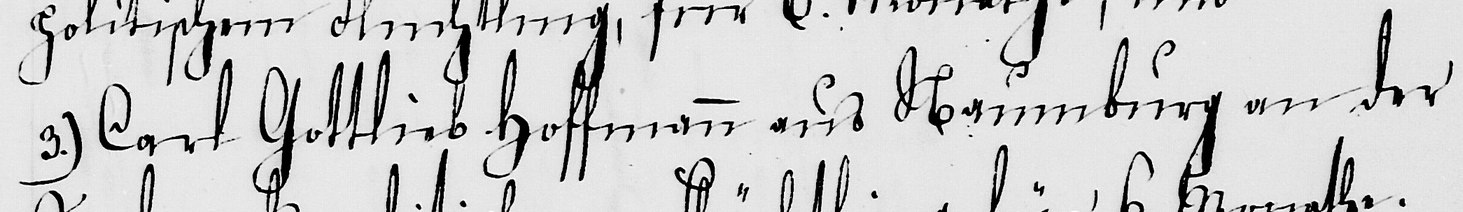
3.) Carl Gottlieb Hoffmann aus Naumburg an der
